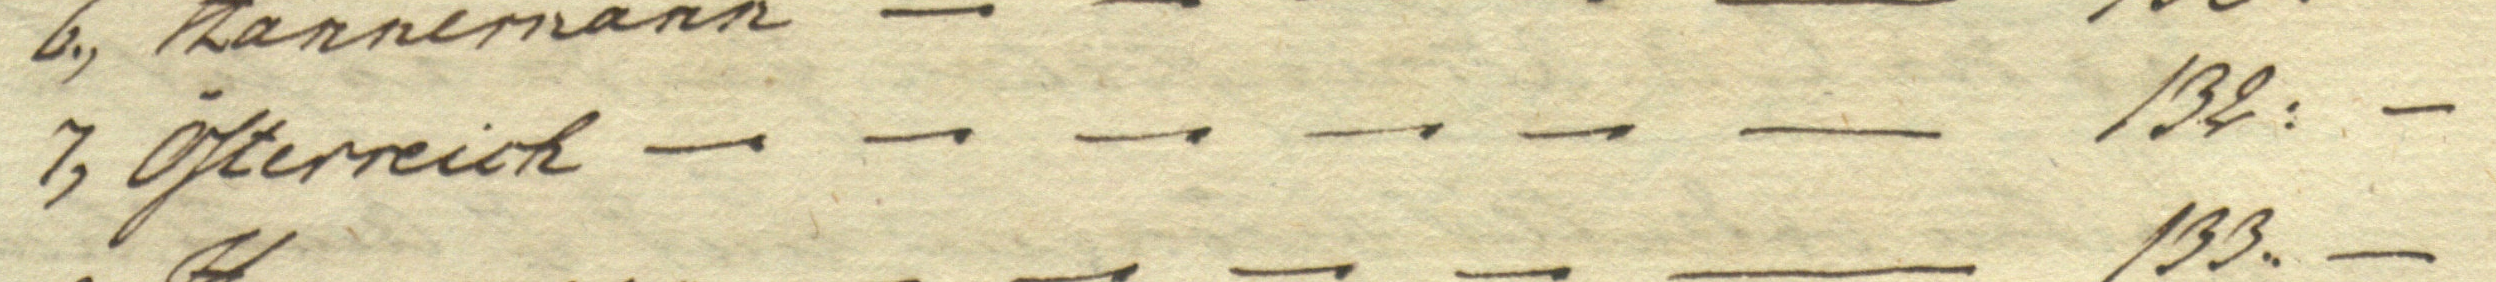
7., Österreich 132:
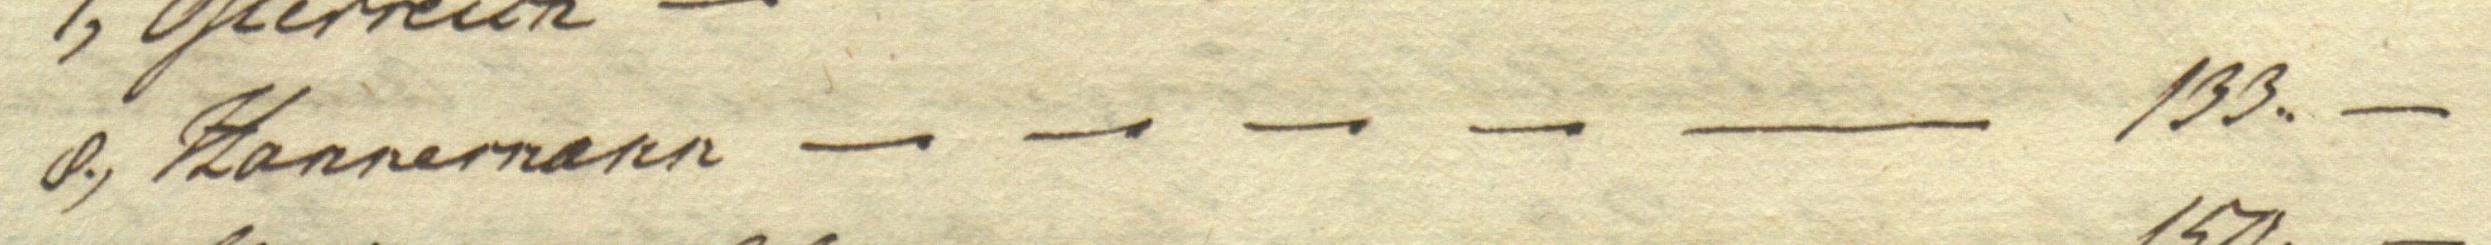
8., Hannemann 133:
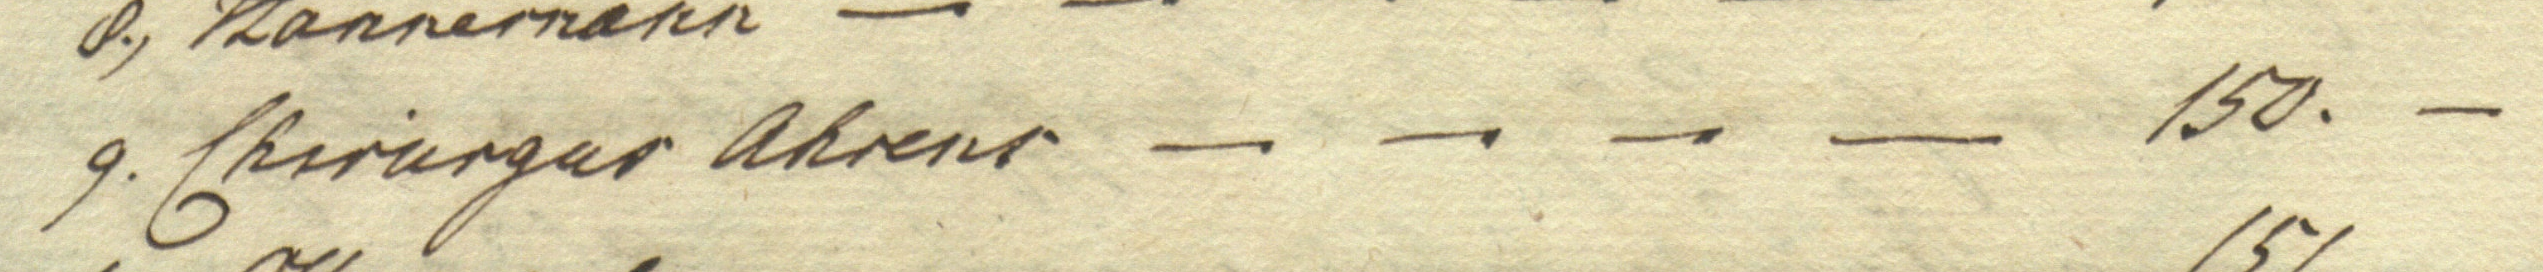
9. Chirurgus Ahrens 150:
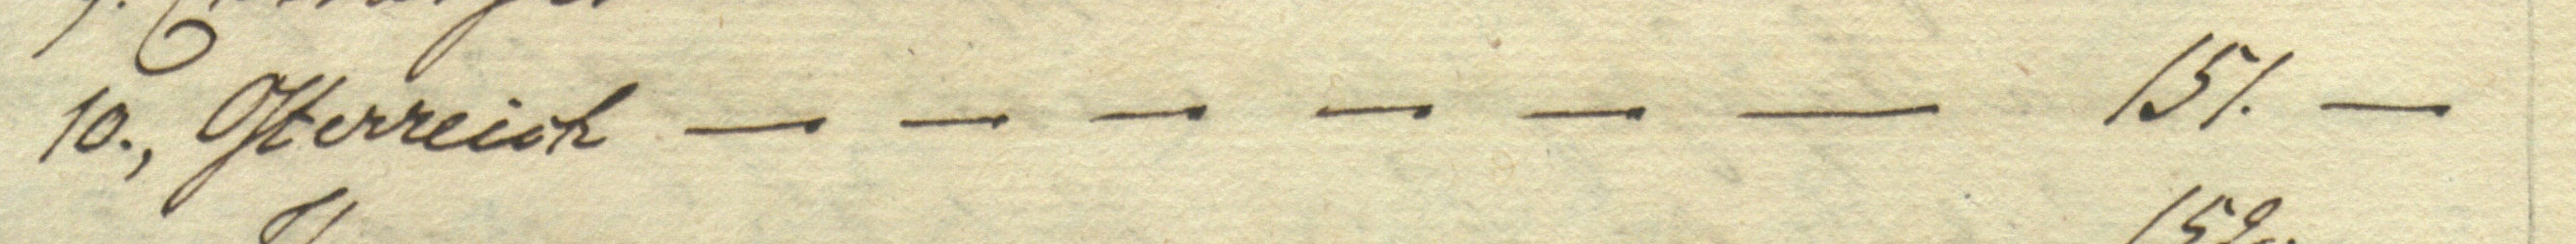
10. Osterreich 151:
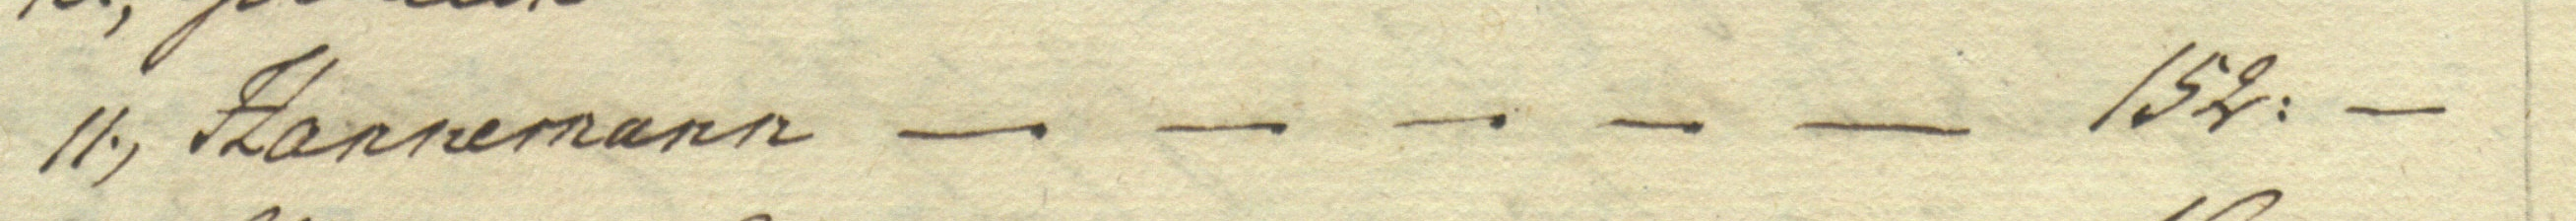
11., Hannemann 152:
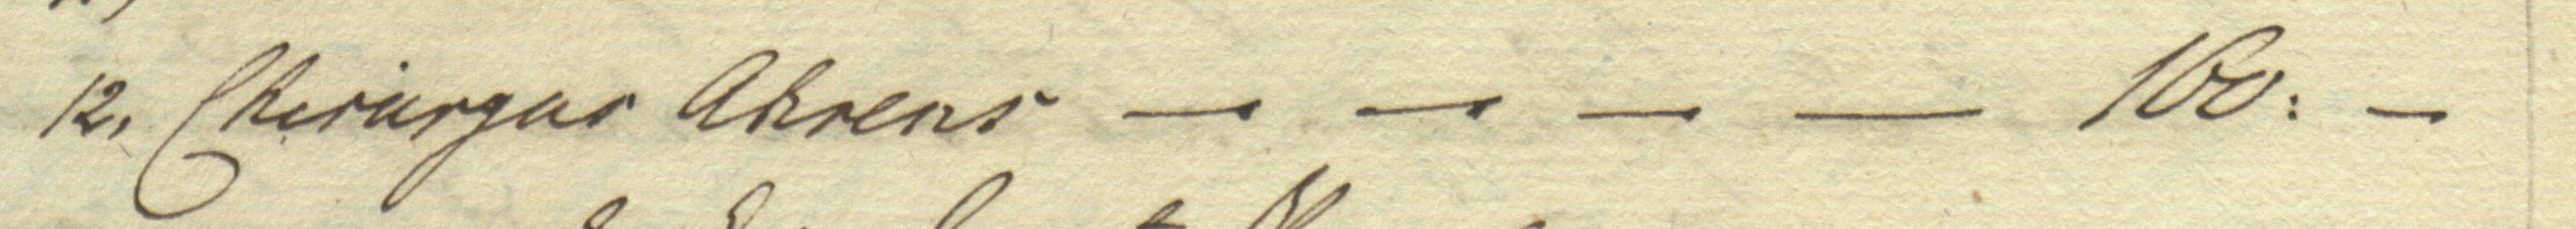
12, Chirurgus Ahrens 160:
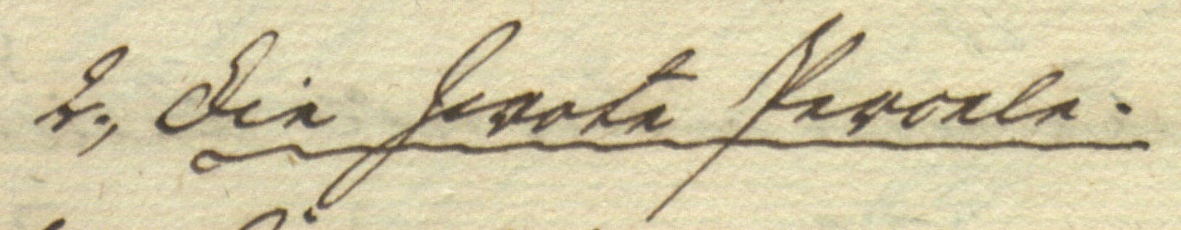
2., Die zwote Percele.
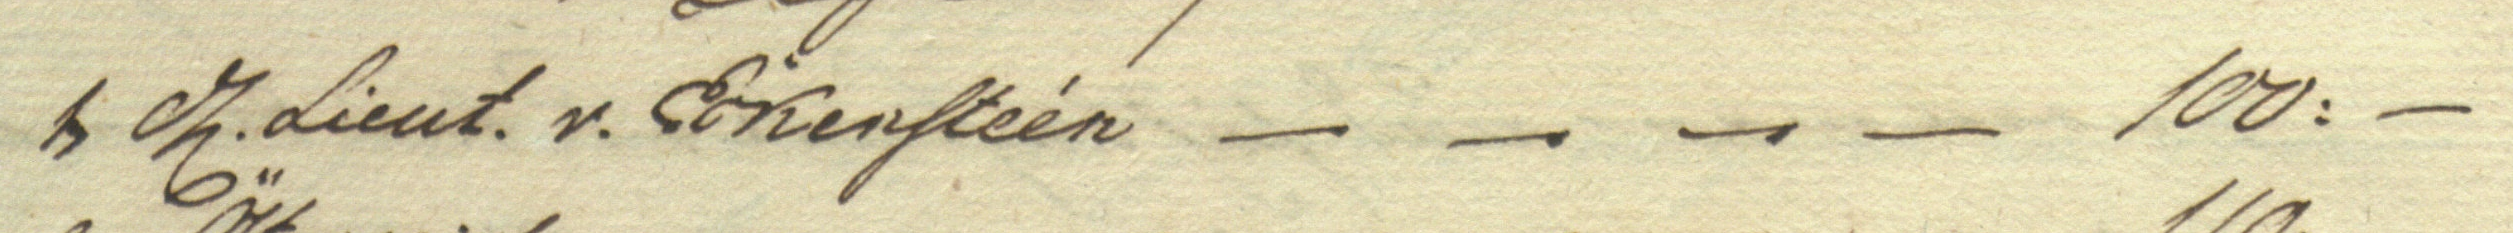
1, dh. Lieut. v. Eckensteén 100:
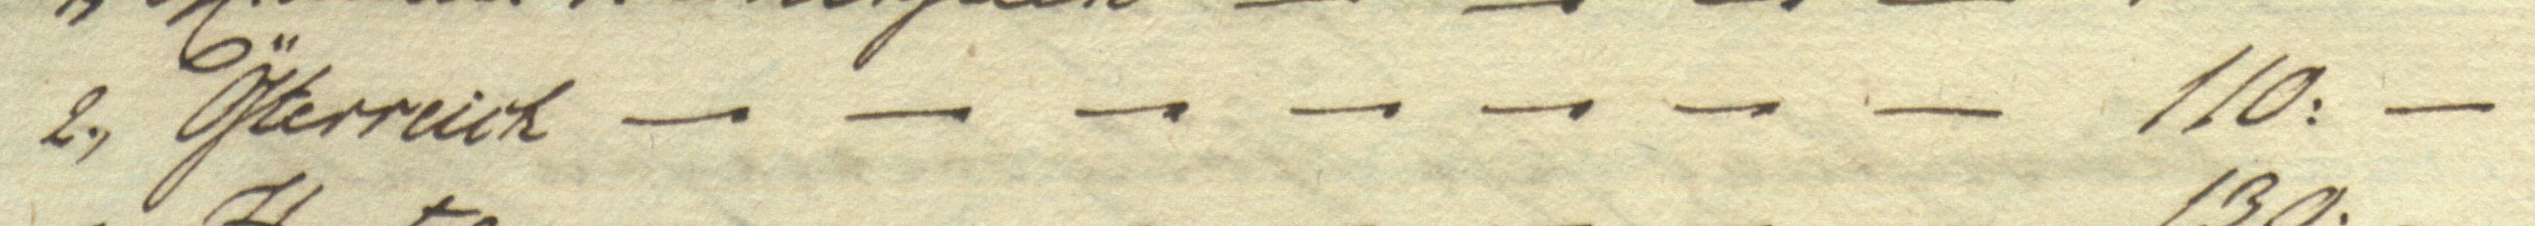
2., Österreich 110:
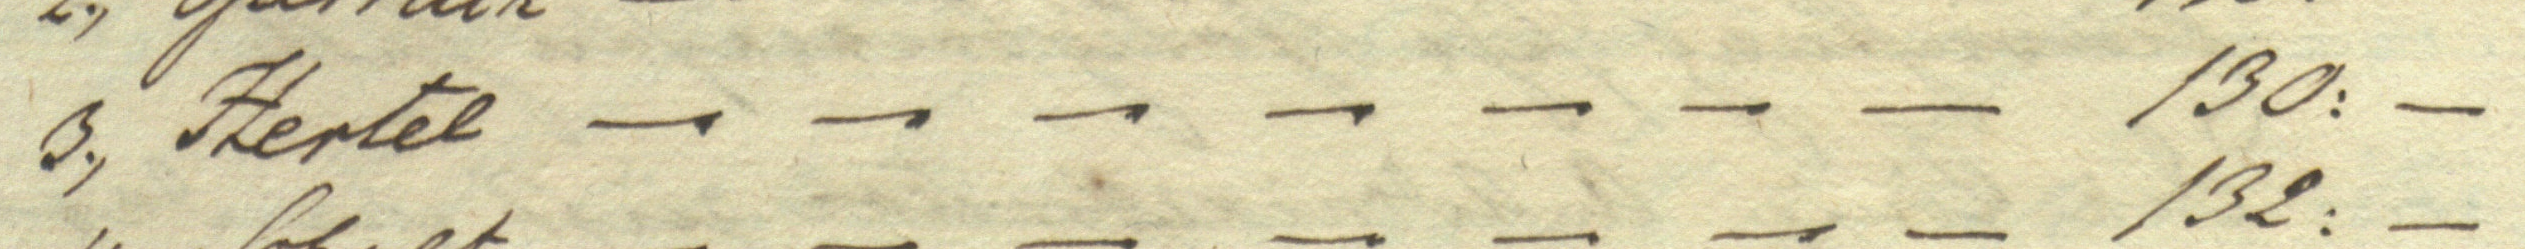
3., Hertel 130:
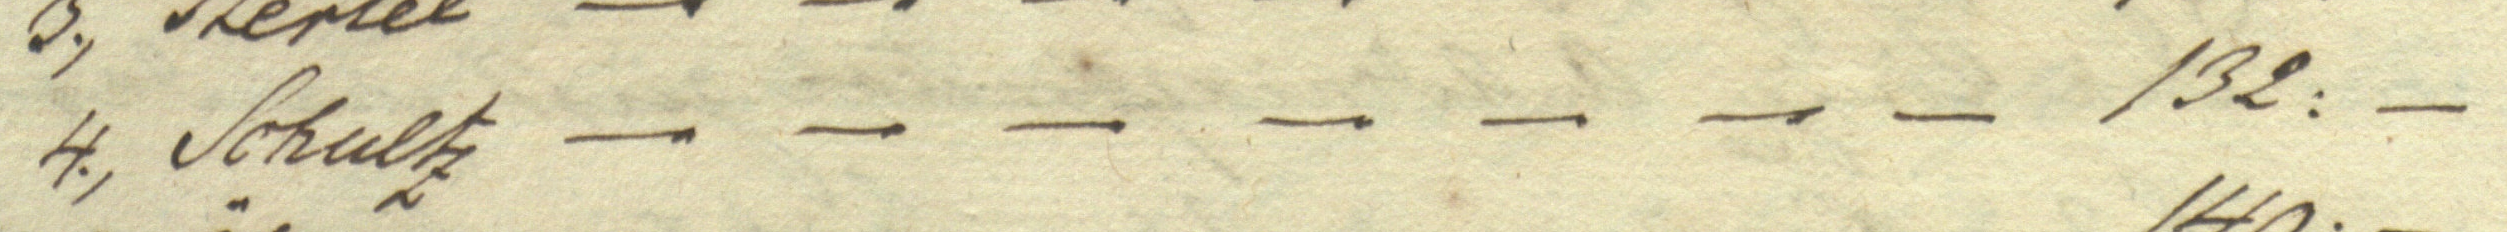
4., Schultz 132:
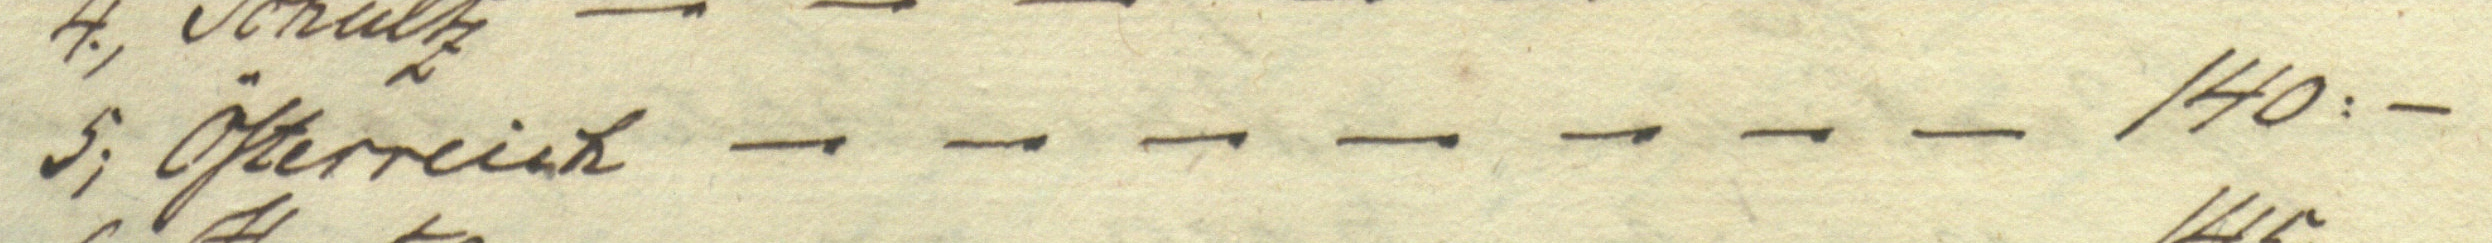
5, Österreich 140:
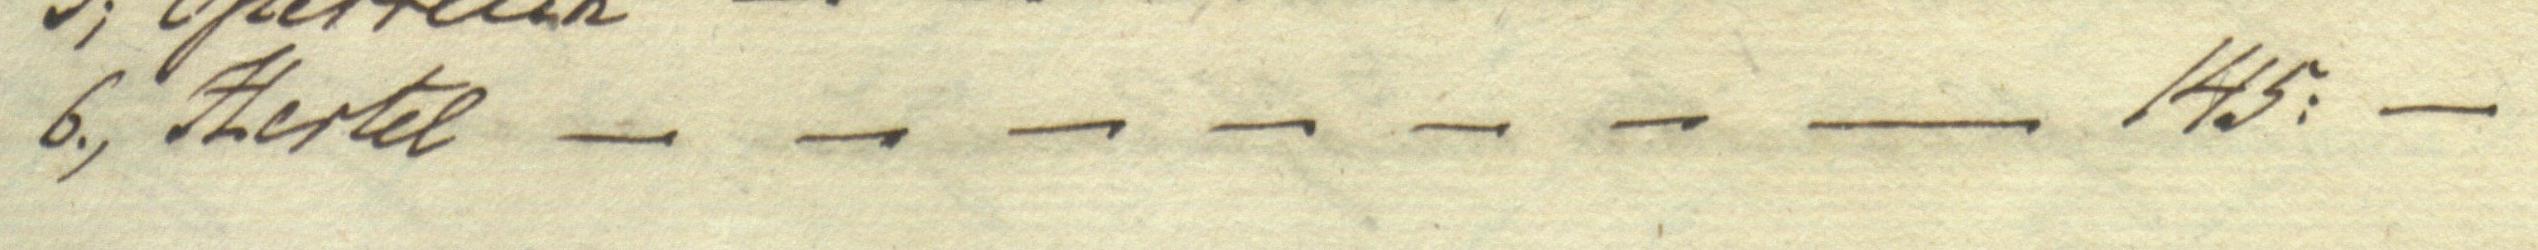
6., Hertel 145:
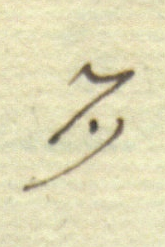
7.,
